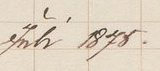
Juli 1875.
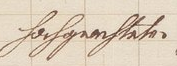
Hochgeachteter
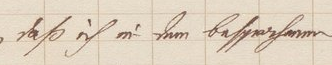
Beehre mich Ihnen mitzutheilen,
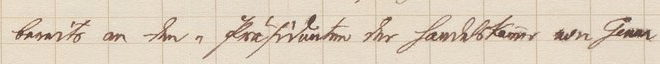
bereits an den «Präsidenten der Handelskammer von Genua
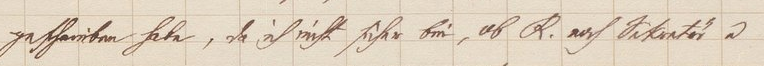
geschrieben habe, da ich nicht sicher bin, ob R. noch Sekretär &
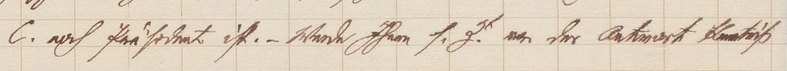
C. noch Präsident ist. – Werde Ihnen s. Zt von der Antwort Kenntniß
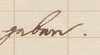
geben.
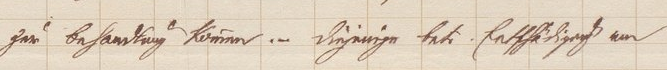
zur Behandlung kommen. – Diejenige betr. Entschädigung an
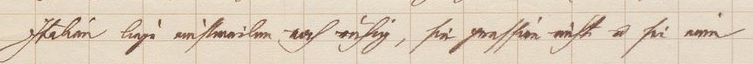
Italien liege einstweilen noch ruhig, sie pressire nicht & sei eine
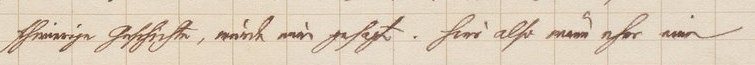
schwierige Geschichte, wurde mir gesagt. Hier also wäre eher eine
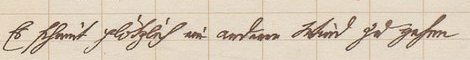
Es scheint plötzlich ein anderer Wind zu gehen.
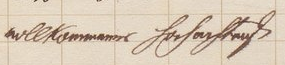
vollkommener Hochachtung
